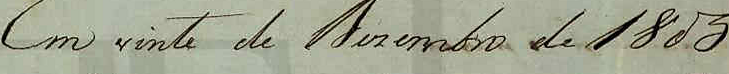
Em vinte de Dezembro de 1803
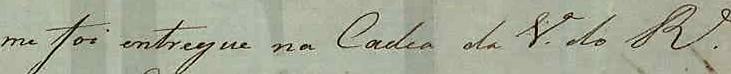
me foi entregue na Cadea da V.a do R.e
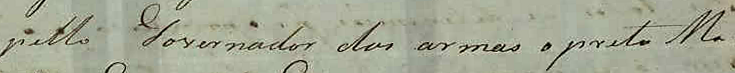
pello Governador das armas o preto Ma
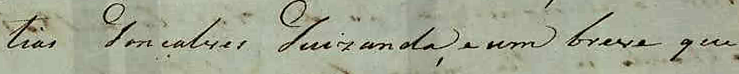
tias Goncalves Guizanda, e um breve que
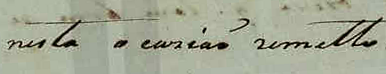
nesta ocaziaõ remetto.
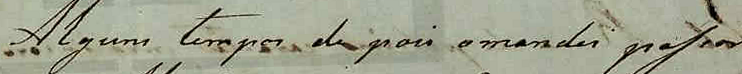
Alguns tempos depois o mandei passar
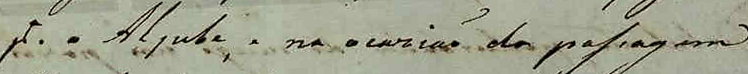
p.a o Aljube, e na ocaziaõ da passagem
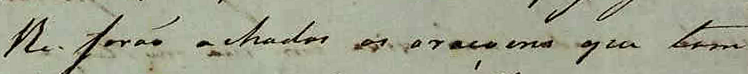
lhe foraõ achadas os oraçoens que tam
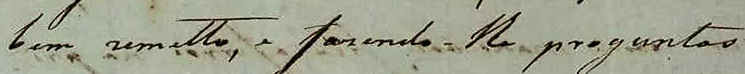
bem remetto, e fazendo-lhe proguntas
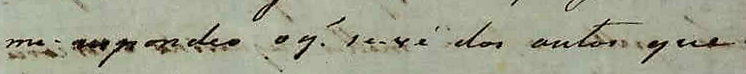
me respondeo o q̄ se vé dos autos que
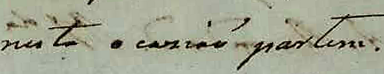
nesta ocaziaõ partem.
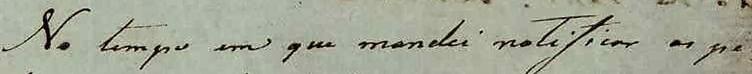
No tempo em que mandei notificar as pe
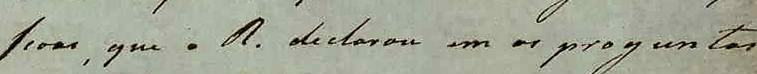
ssoas, que o R. declarou em as proguntas
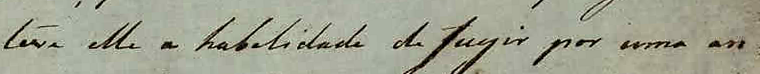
teve elle a habalidade de fugir por uma an
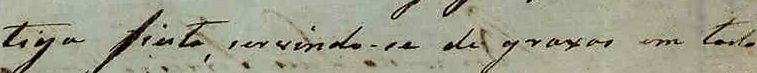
tiga frista, servindo-se de graxas em todo
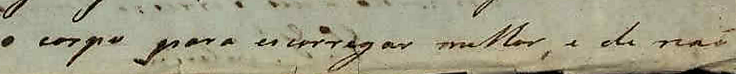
o corpo para escorregar melhor, e de naõ
